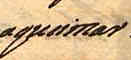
a queimar
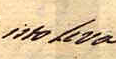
isto leva
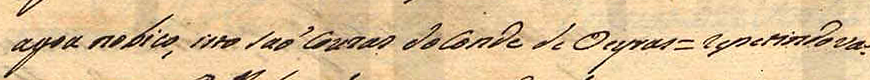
agoa no bico, isto saõ couzas do conde de Oeyras = repetindo va
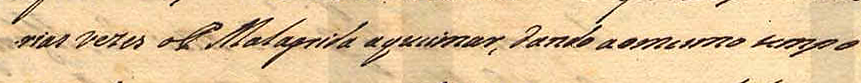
rias vezes o P Malagrida a queimar, dando ao mesmo tempo
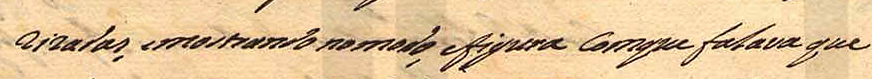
rizadas, e mostrando no modo, e figura com que falava que
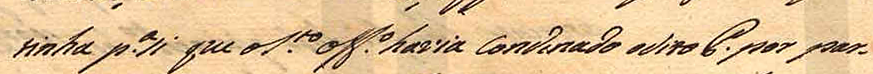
tinha p.a si que o s.to off.o havia condenado o dito P. por par
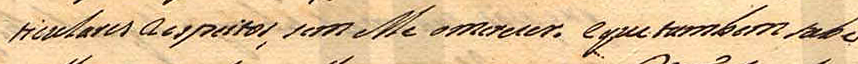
ticulares respeitos, sem elle o merecer. e que tambem sabe
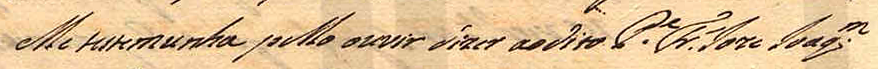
elle testemunha pello ouvir dizer ao dito P.e Fr. Ioze Ioaq.m
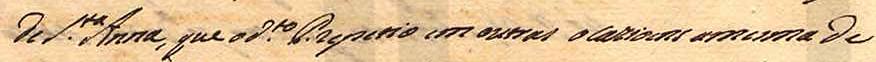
de s.ta Anna, que o d.to P. repetio em outras ocazioens a mesma de
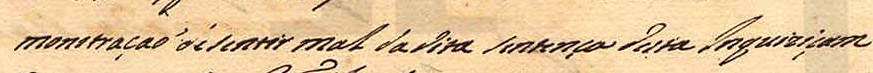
monstraçaõ de sentir mal da dita sentença desta Inquiziçam
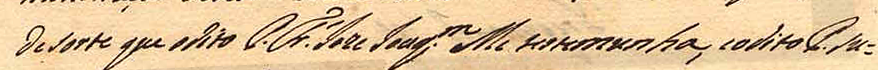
de sorte que o dito P. Fr. Ioze Ioaq.m elle testemunha, e o dito P. su
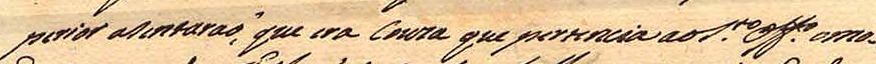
perior asentaraõ, que era couza que pertencia ao s.to Off.o o mo
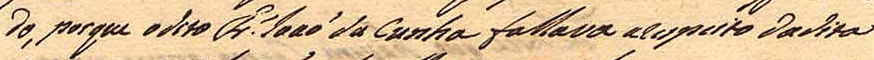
do, porque o dito Fr. Ioaõ da Cunha fallava a respeito da dita
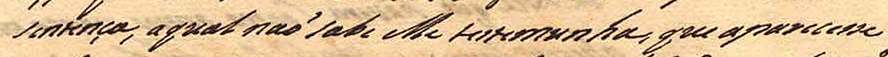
sentença, a qual naõ sabe elle testemunha, que aparecesse
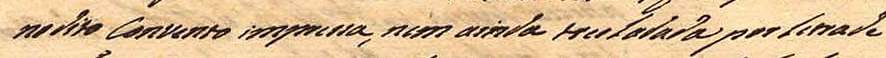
no dito convento impressa, nem ainda tresladada por letra de
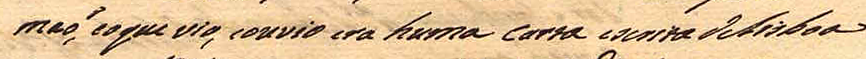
maõ, e o que vio, e ouvio era huma carta escrita de Lisboa
